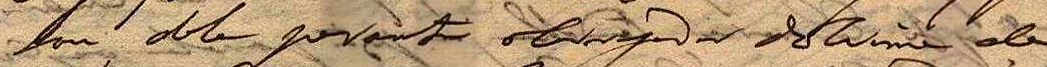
tou dele porante o Corregedor do Crime de
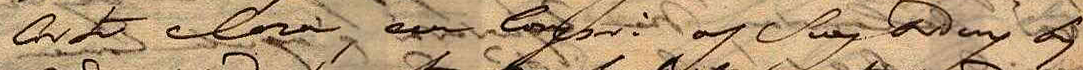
Corte e Caza, em Corpori as Suas ordens dis
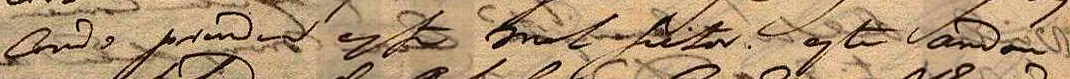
Cendo porender este malfeitor. este andou
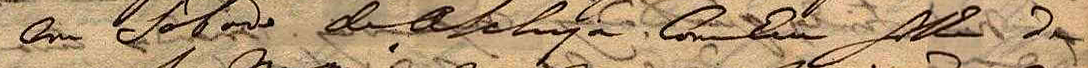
Em Sabado de Aleluja. Com hua folha de
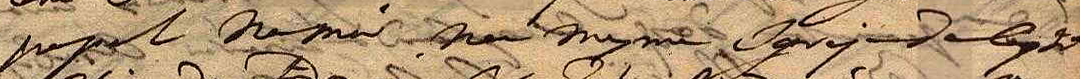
papel na maõ na mesma Igreja de Castra
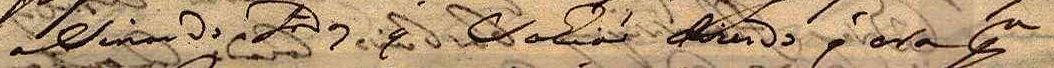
asinando todos q̄ Sahiaõ dizendo q̄ era pa
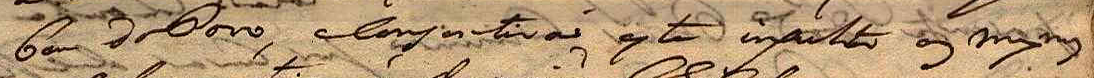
bem do Povo, e consentiraõ este inxulto os mesmos
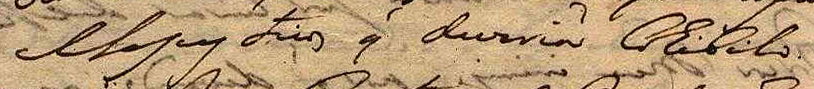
eClesiasticos q̄ deveriaõ Cohibilo.
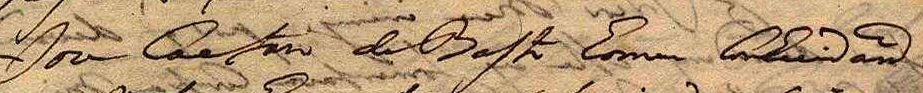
Joze Caetano de Basto homen Conhecidamte
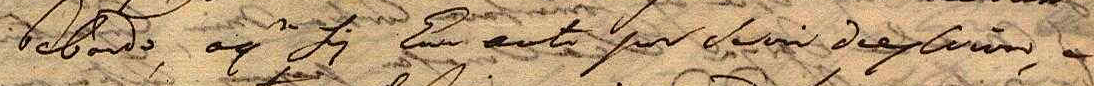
bebado, a qm fis hum auto por servir de esCrivan, e
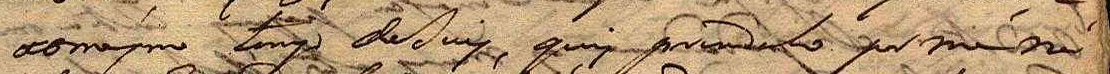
ao mesmo tempo de Iuis, quis prendelo por menaõ
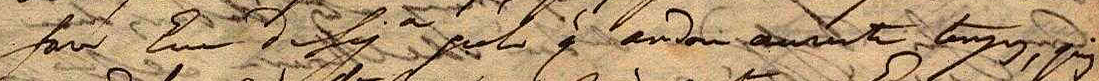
fazer hua deLiga pelo q̄ andou auzente tenpos, quis
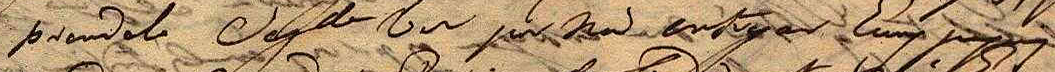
prendelo Segda vez por naõ entregar huns papeis
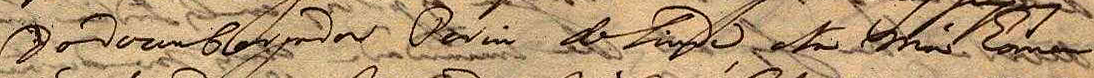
do dezembargador Perseu de Linde, e hu máo homen
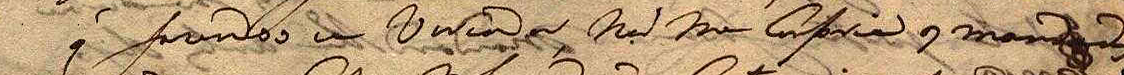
q̄ fazendoo eu Vereador, naõ me Conferia os mandados
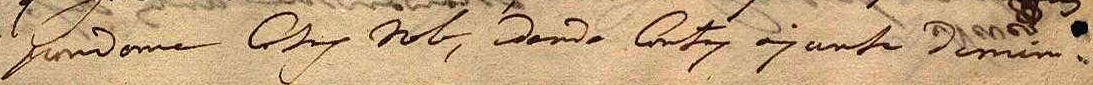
pondome Cotas nele, e dando Contas a junta de mim.
